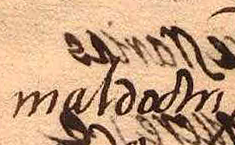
mal doctri
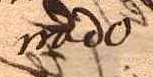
nado
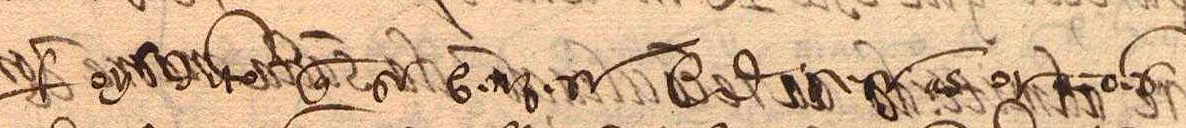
foy dito q̄ se benzese e disese as oraçoẽs
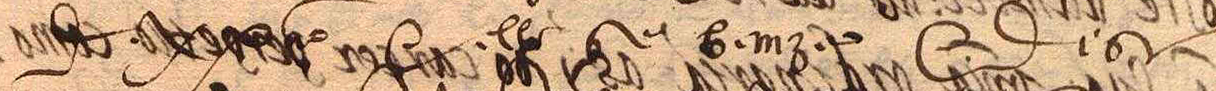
de Xpão e elle se bemzeo E dise
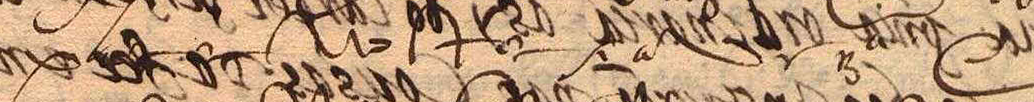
pater noster e ave ma e
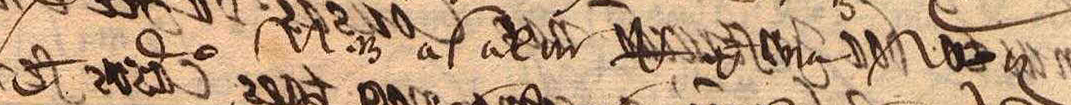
credo nem a salue Regina nem
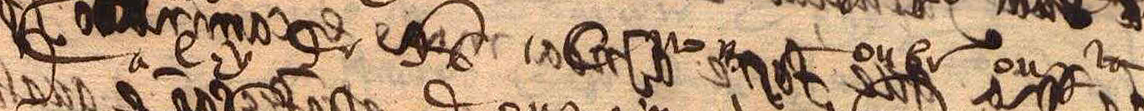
da ley de ds̄ e nom soube outra
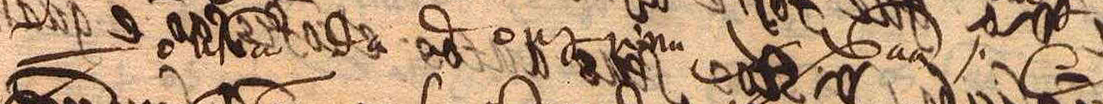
Cousa da doutrina Xpāa /. e
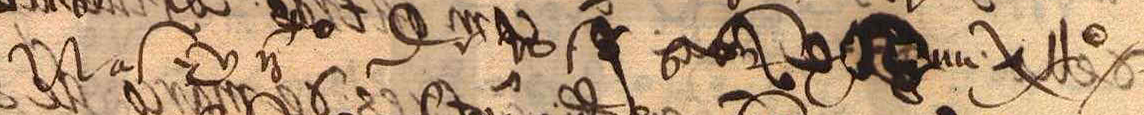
o Nascymto de noso sōr Jhuu Xo /
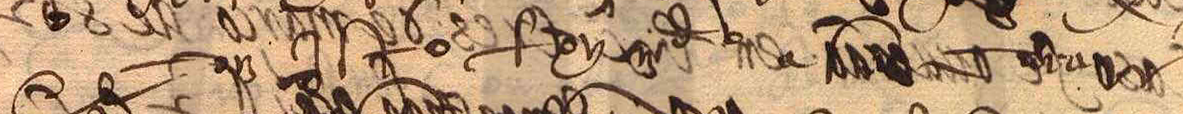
e com Jsto foy mdo a seu carcere
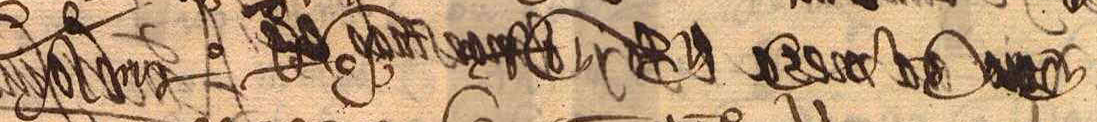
Anto RoJ̄z o stp̄vy e Asyney
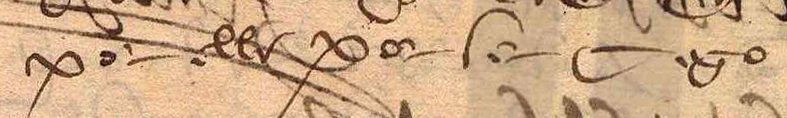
por elle por ser cego
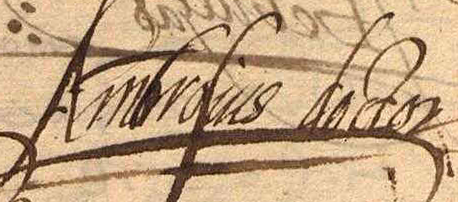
Ambrosius doctor
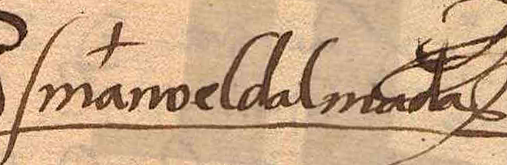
manoel dalmada
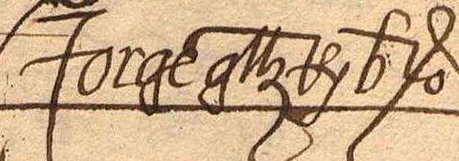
Jorge gllz̄ Ryb̄ro
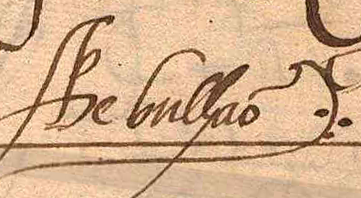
Ao De bulhaõ
